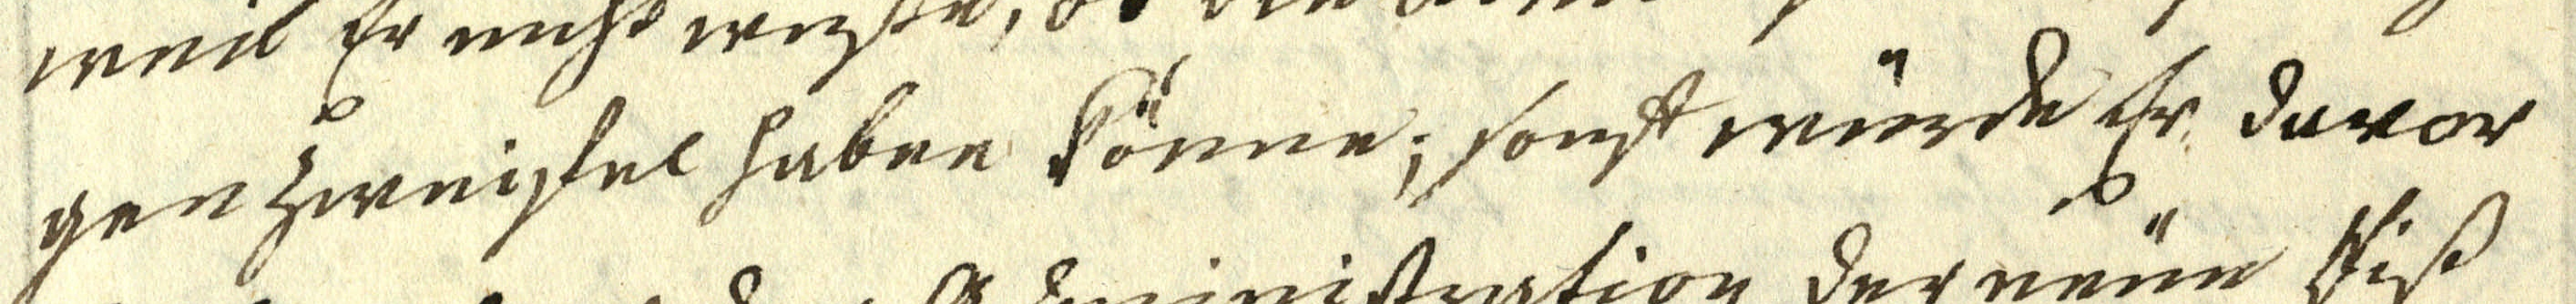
gen Zweifel haben könne, sonst würde Er davor
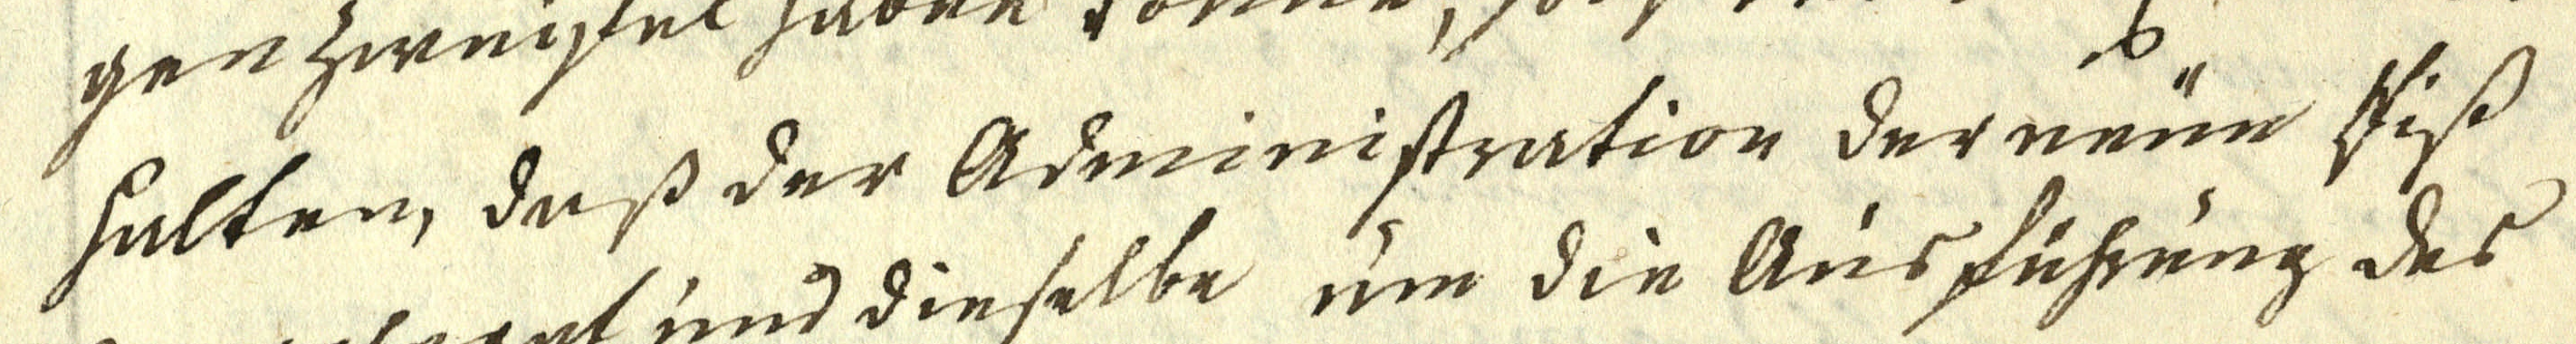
halten, daß der Administration der neue Riß
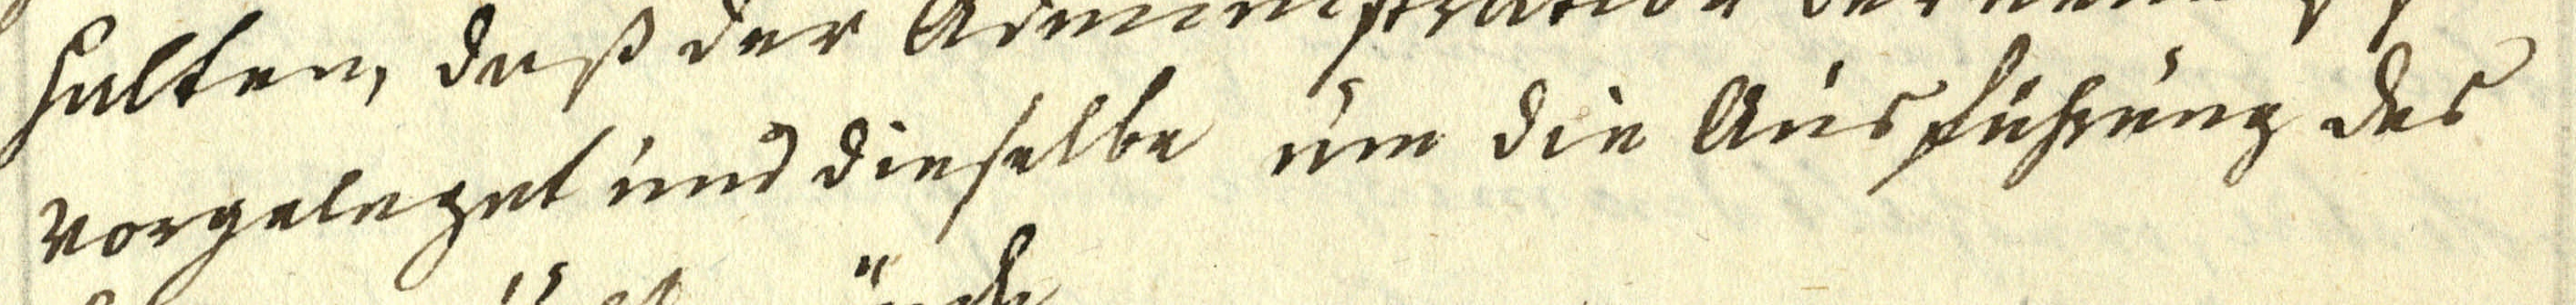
vorgeleget und dieselbe um die Ausführung des
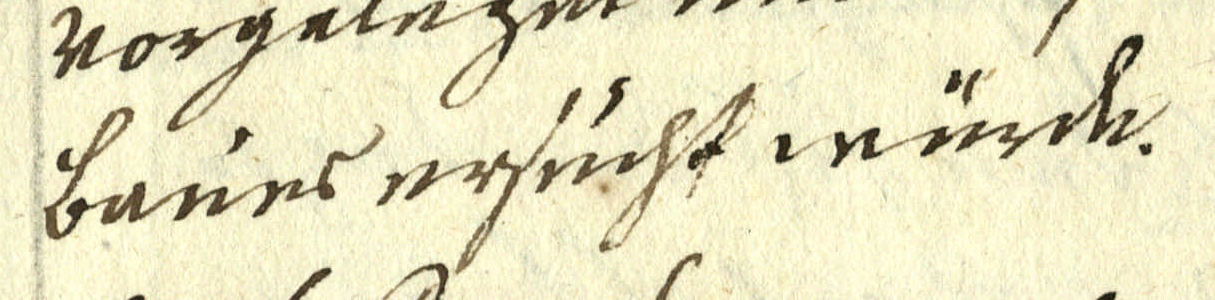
Baues ersucht würde.
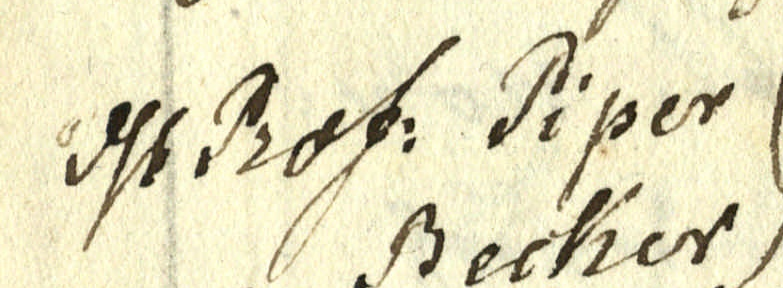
dh Prof. Piper
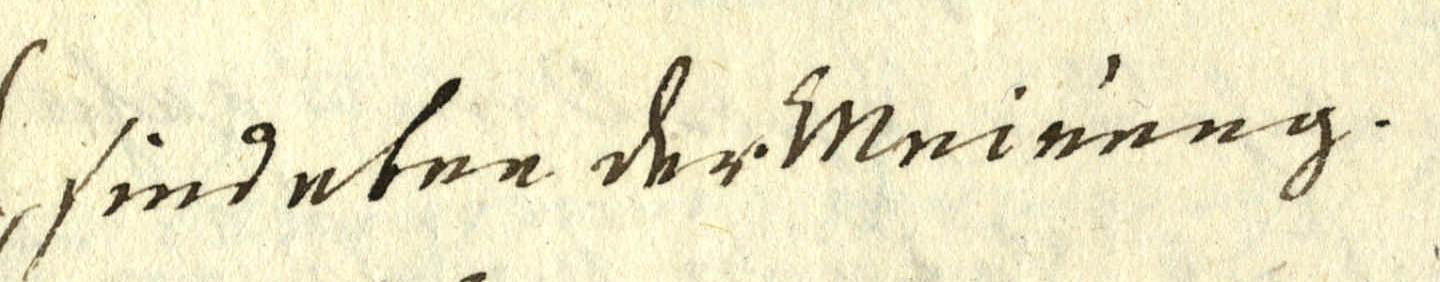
sind eben der Meinung.
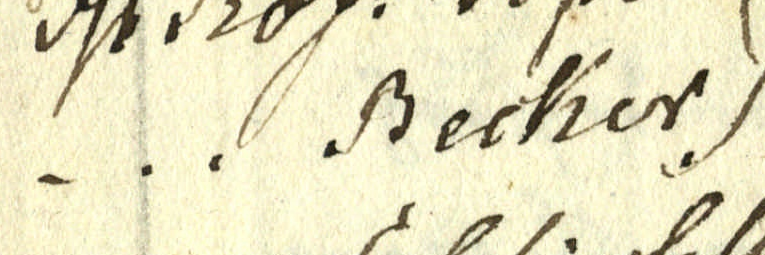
Becker,
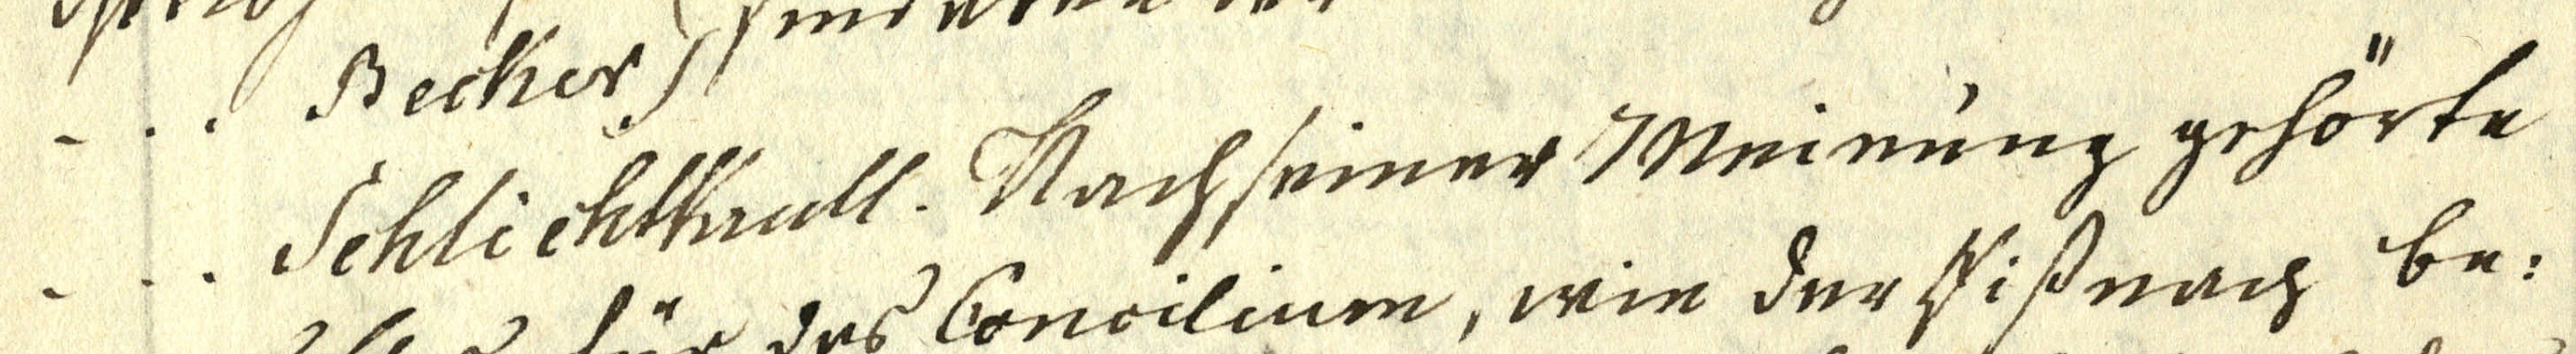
Schlichtkrull. Nach seiner Meinung gehörte
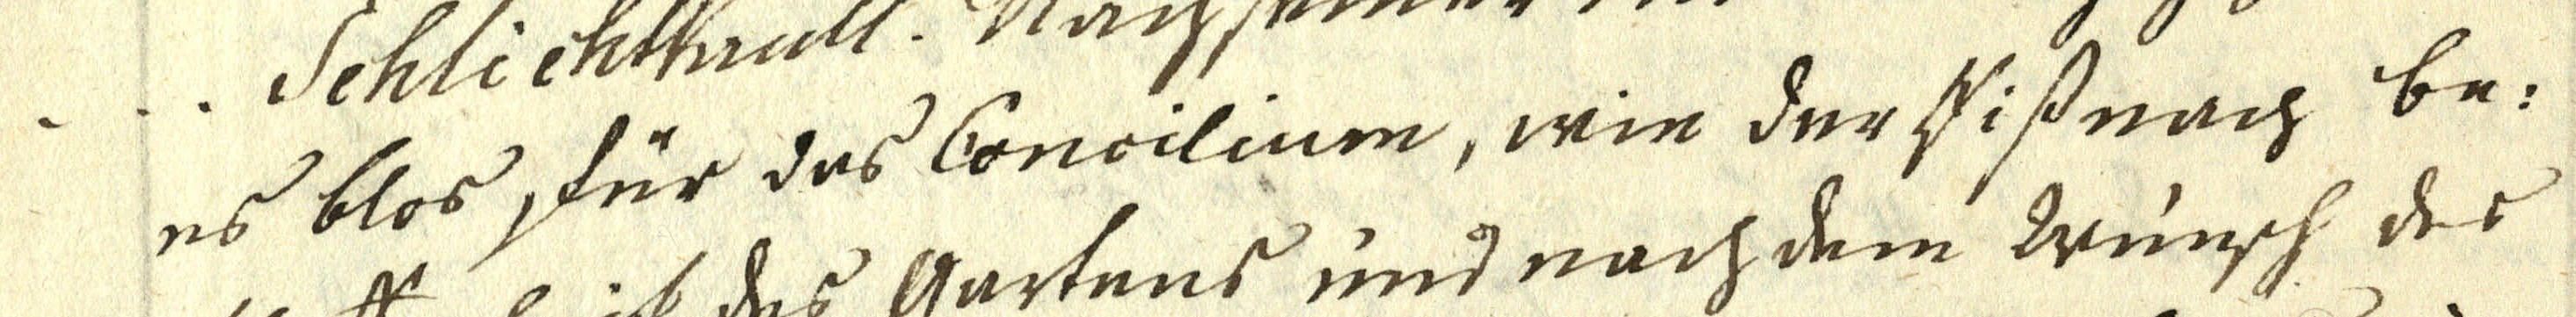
es blos für das Concilium, wie der Riß nach Be¬
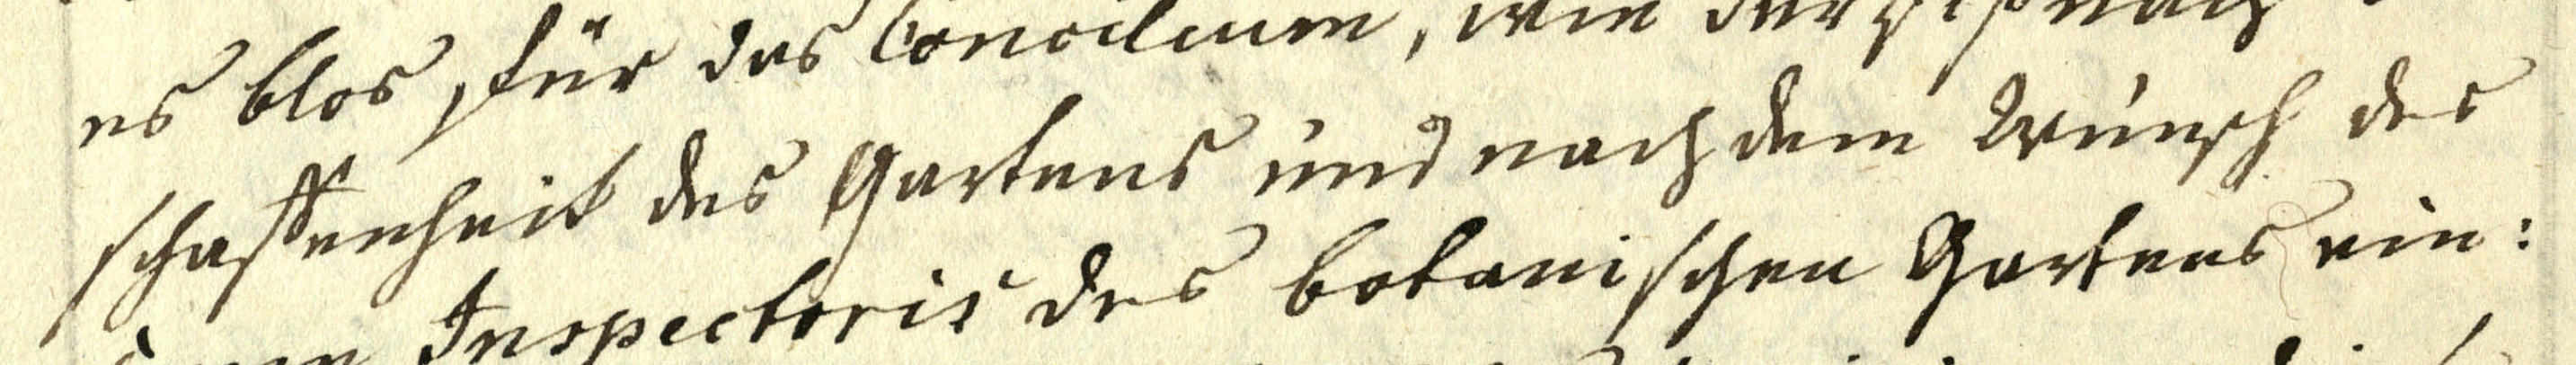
schaffenheit des Gartens und nach dem Wunsch der
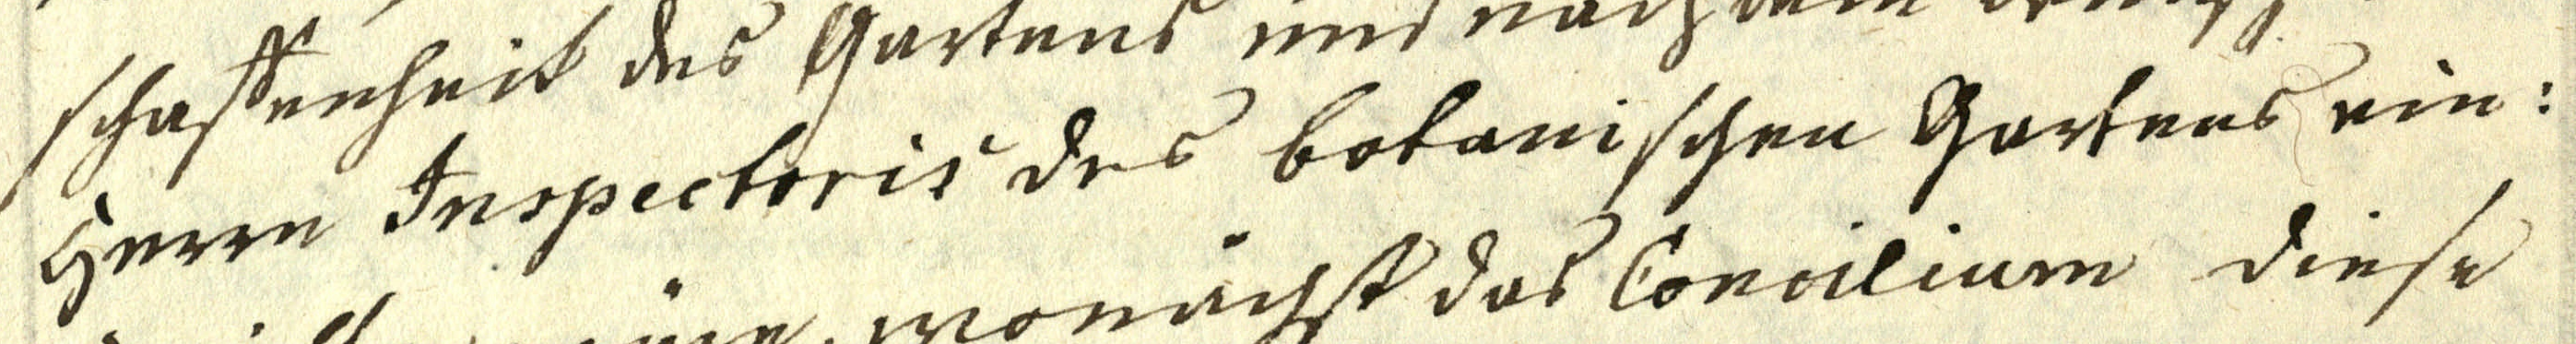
Herrn Inspectoris des Botanischen Gartens ein¬
